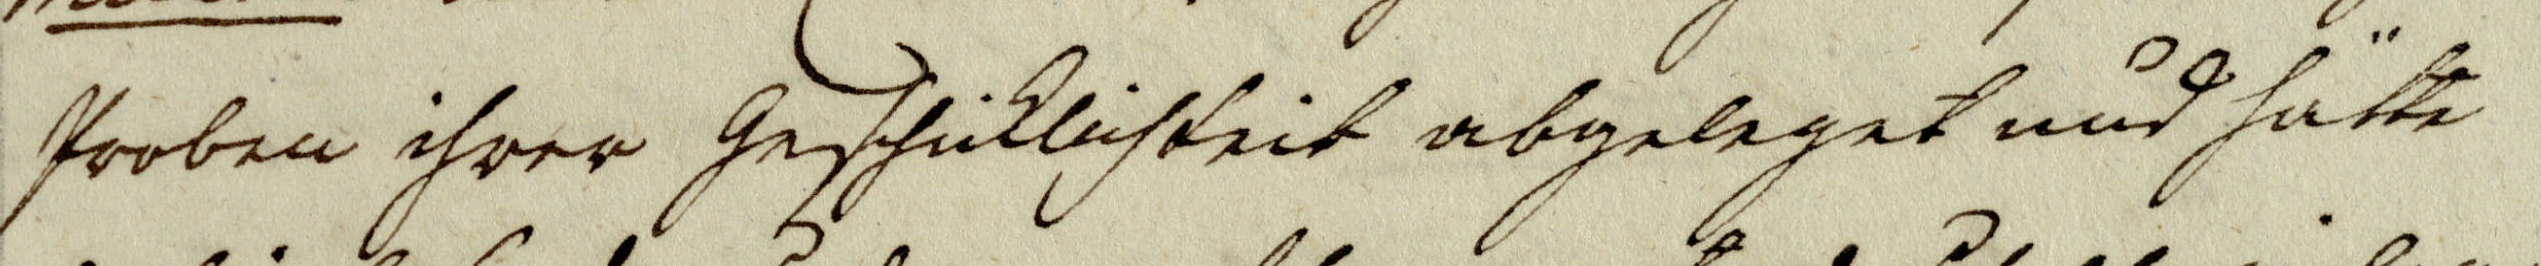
Proben ihrer Geschicklichkeit abgeleget und hätte
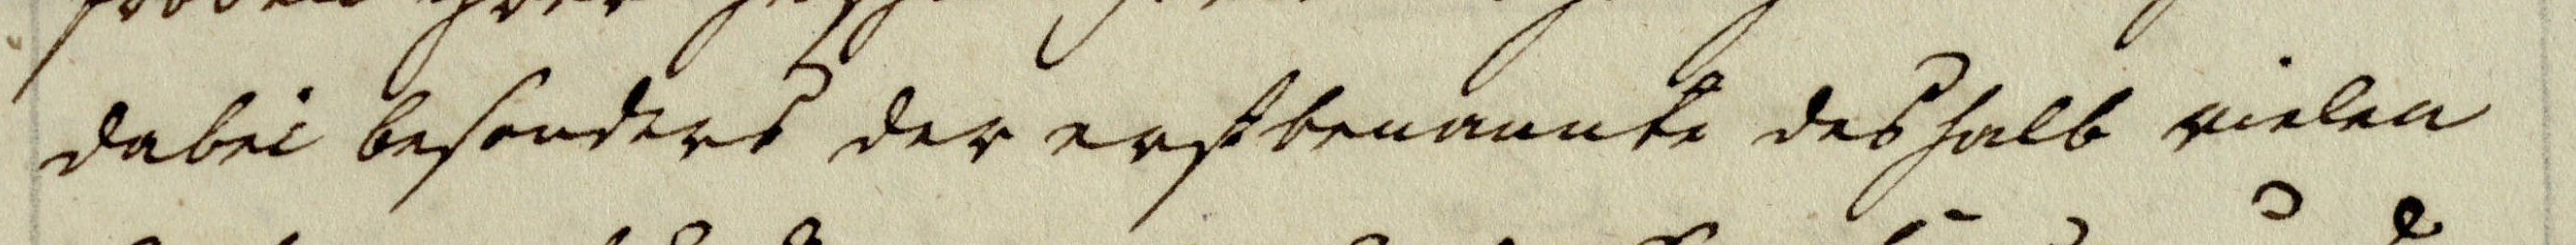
dabei besonders der erstbenannte deshalb vielen
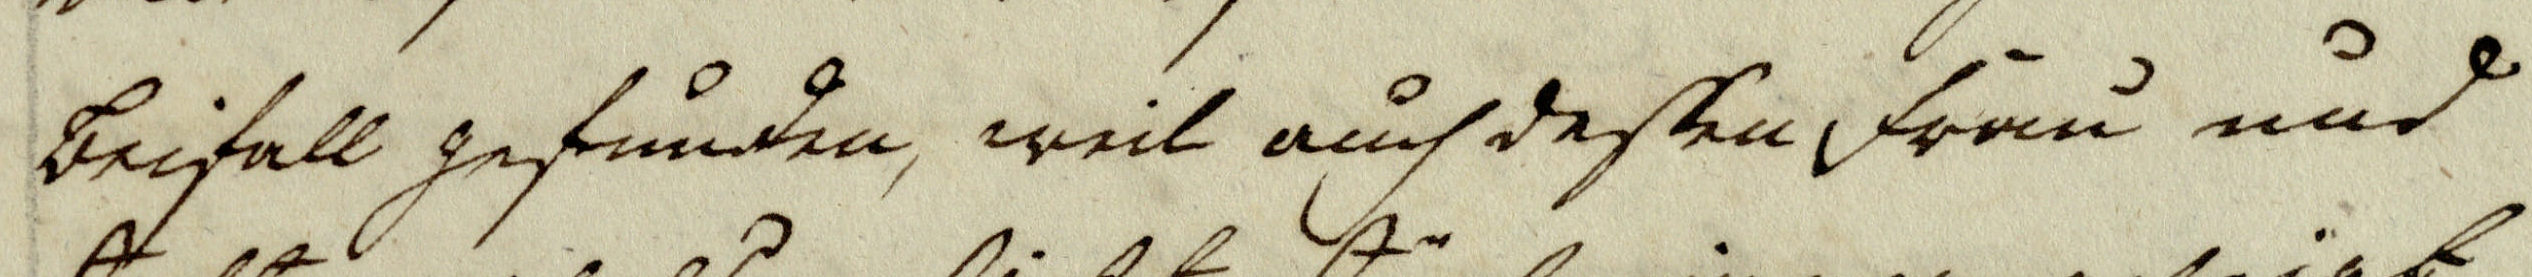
Beifall gefunden, weil auch dessen Frau und
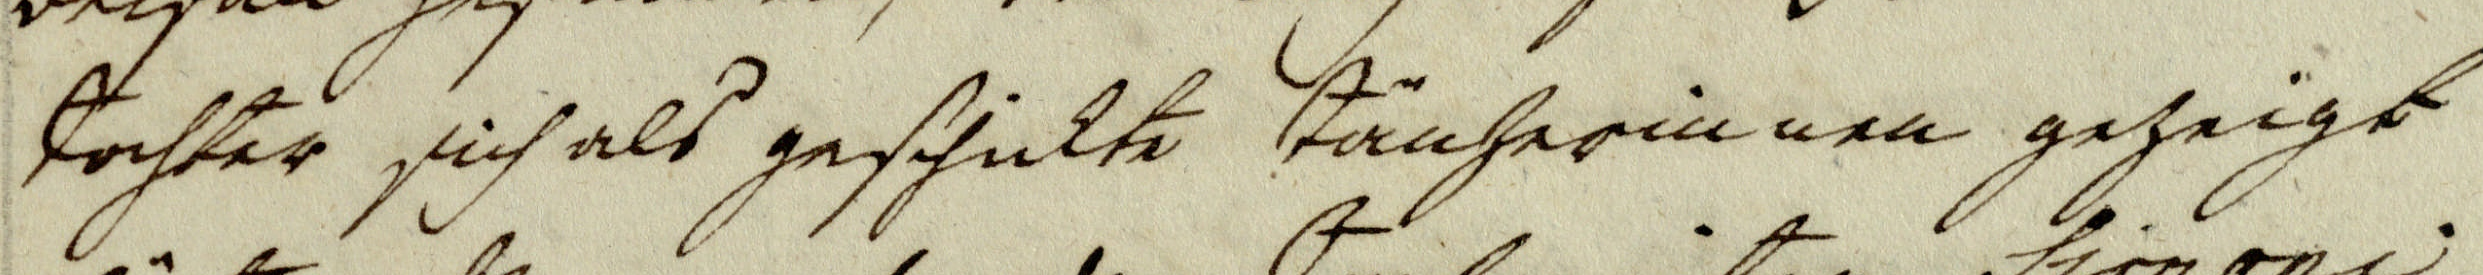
Tochter sich als geschickte Tänzerinnen gezeigt
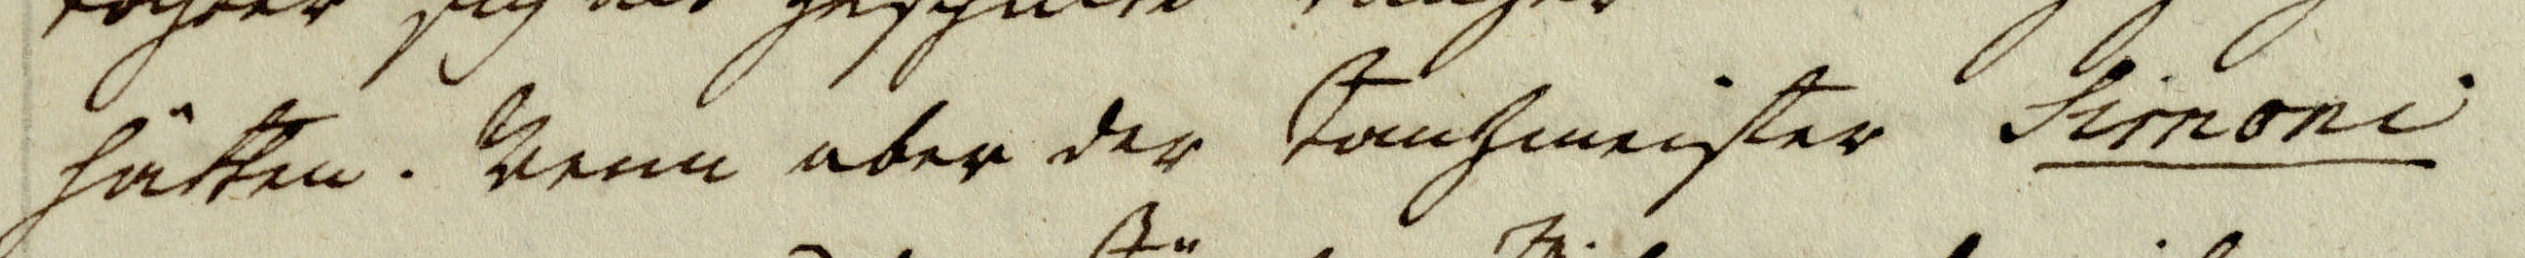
hätten. Wenn aber der Tanzmeister Simoni
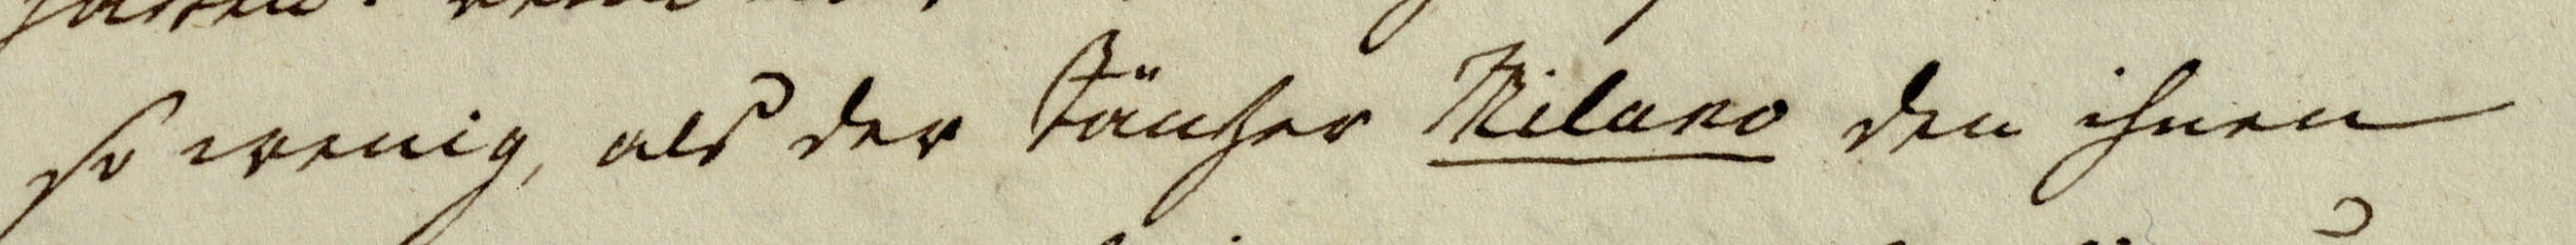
so wenig, als der Tänzer Milano den ihnen
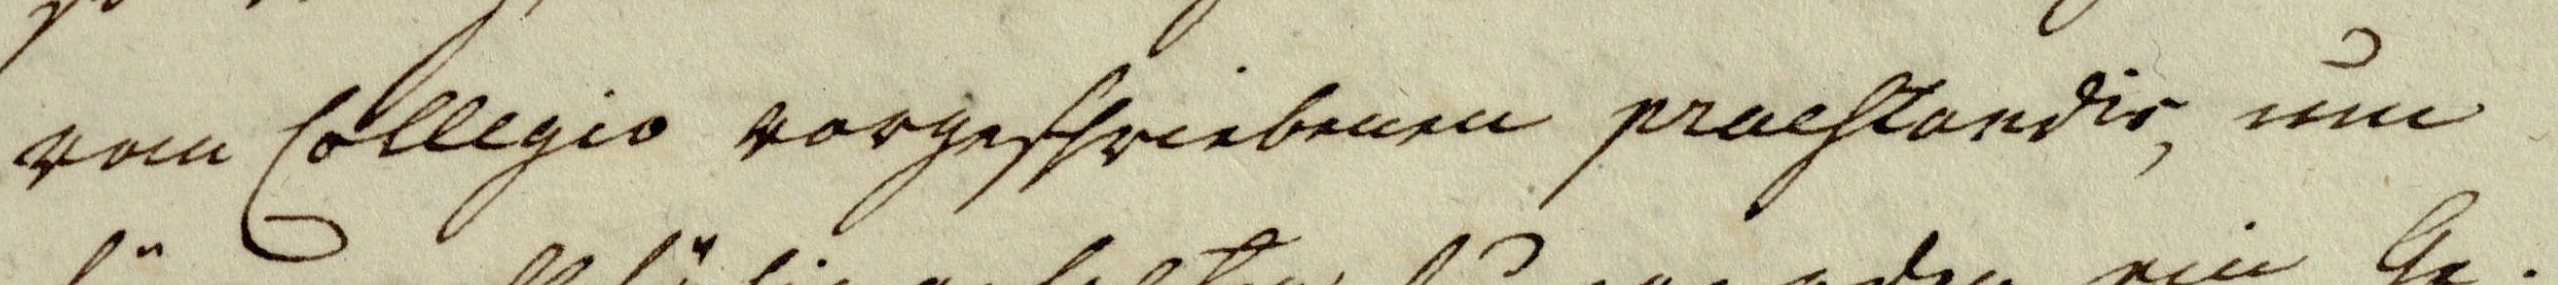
vom Collegio vorgeschriebenen praestandis, um
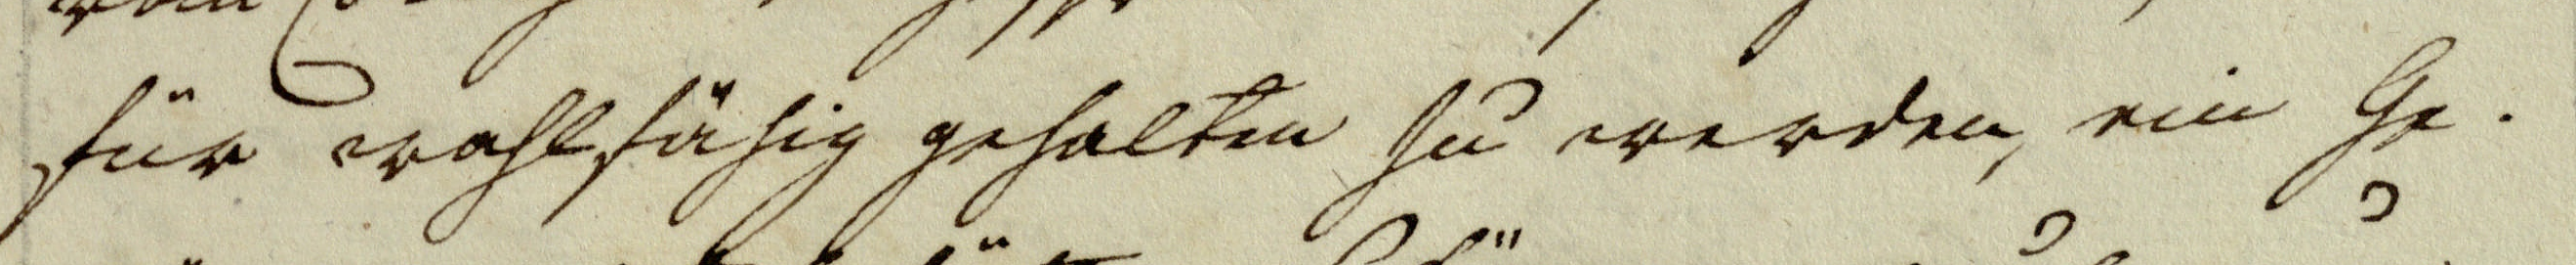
für wahlfähig gehalten zu werden, ein Ge¬
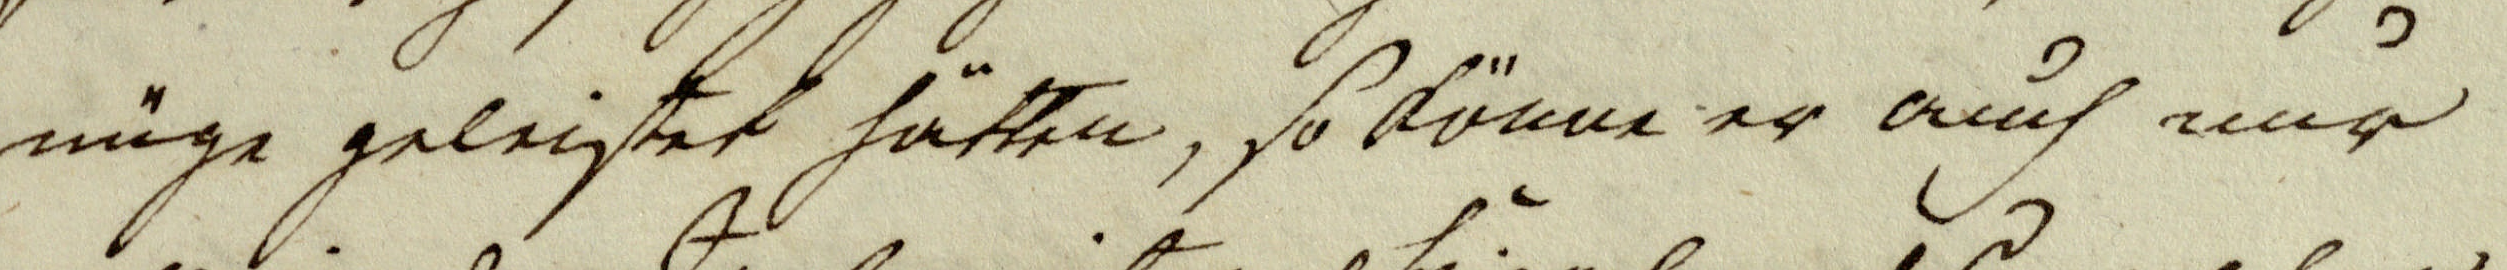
nüge geleistet hätten, so könne er auch nur
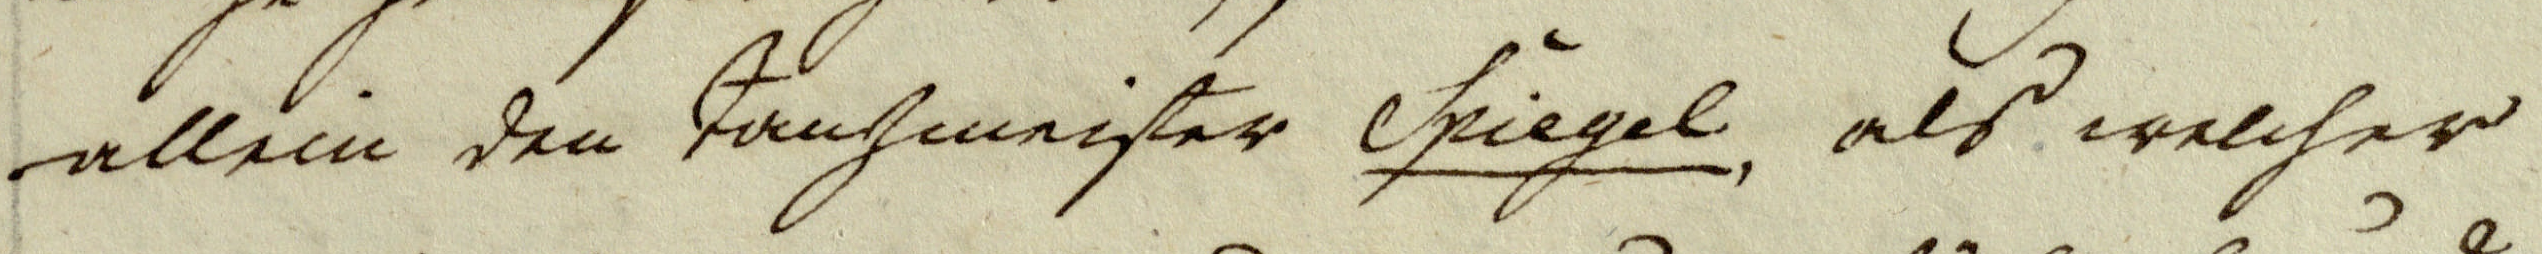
allein den Tanzmeister Spiegel, als welcher
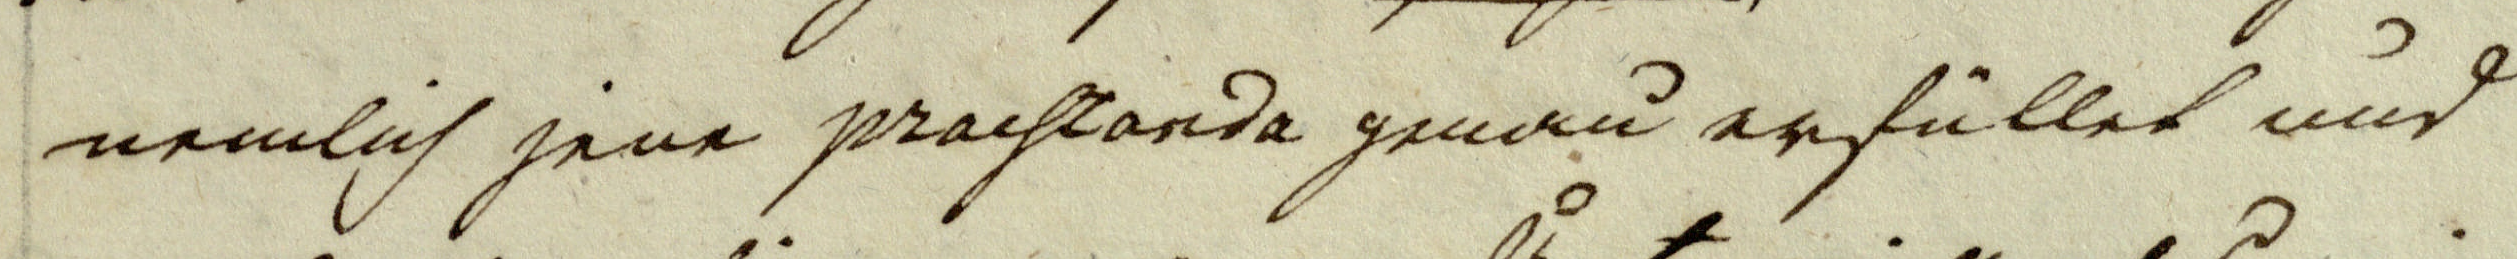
nemlich jene praestanda genau erfüllet und
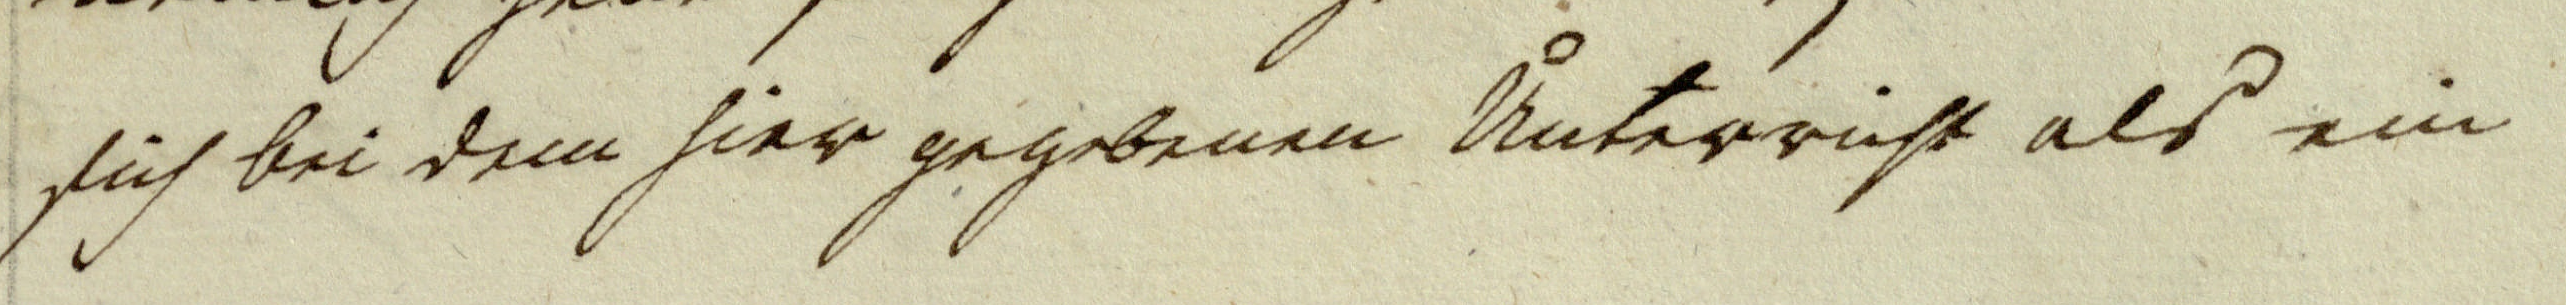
sich bei dem hier gegebenen Unterricht als ein
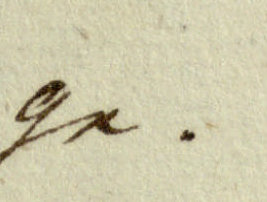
ge¬
